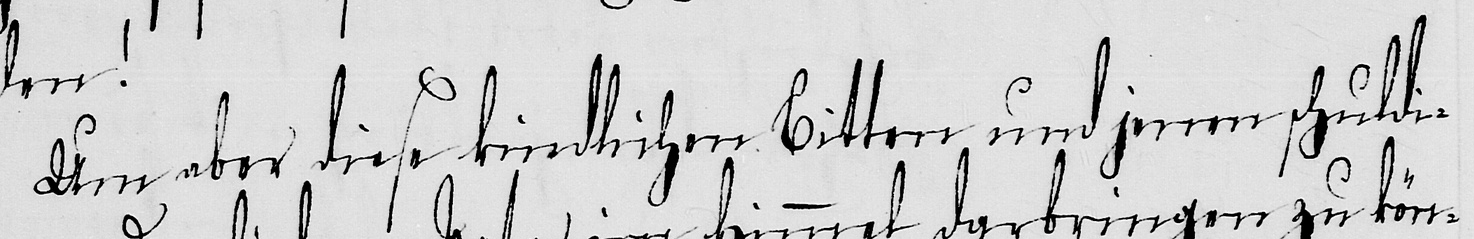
Um aber diese kindlichen Bitten und jenen schuld¬
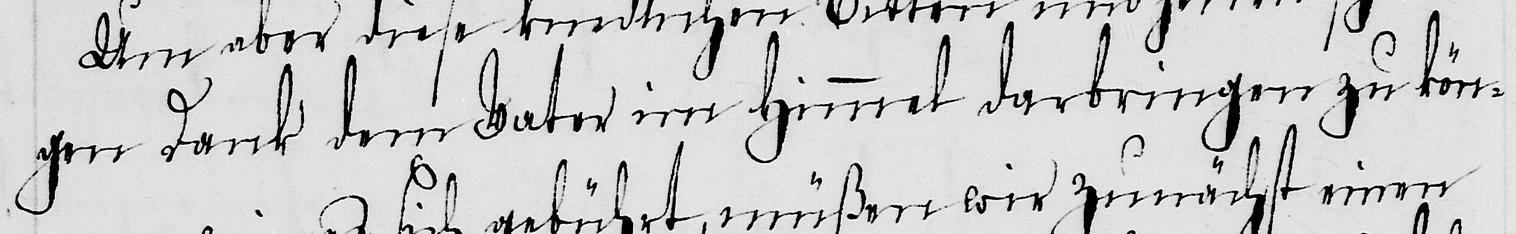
igen Dank dem Vater im Himmel darbringen zu kön¬
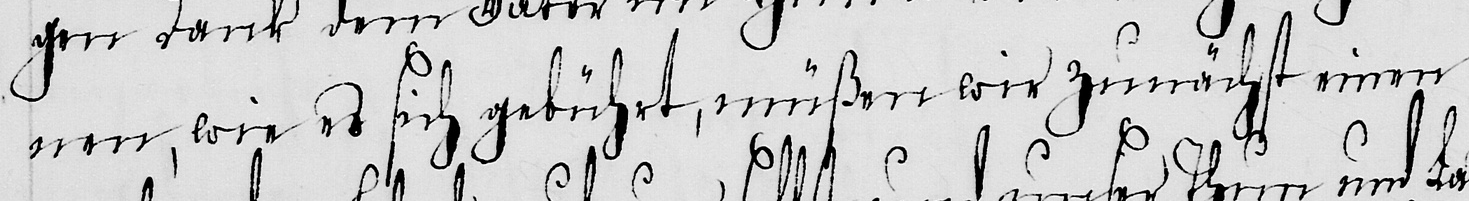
nen, wie es sich gebührt, müßen wir zunächst einen
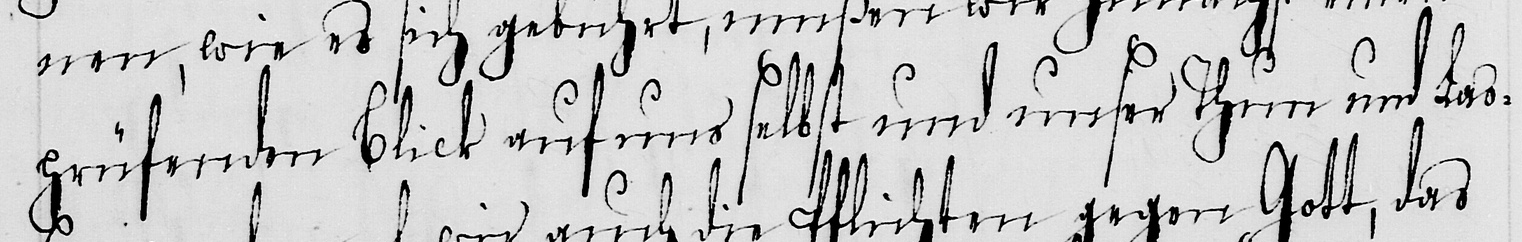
prüfenden Blick auf uns selbst und unser Thun und La¬
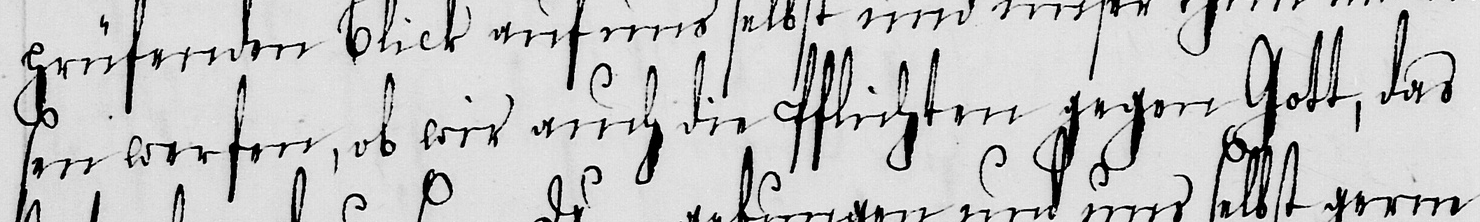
ßen werfen, ob wir auch die Pflichten gegen Gott, das
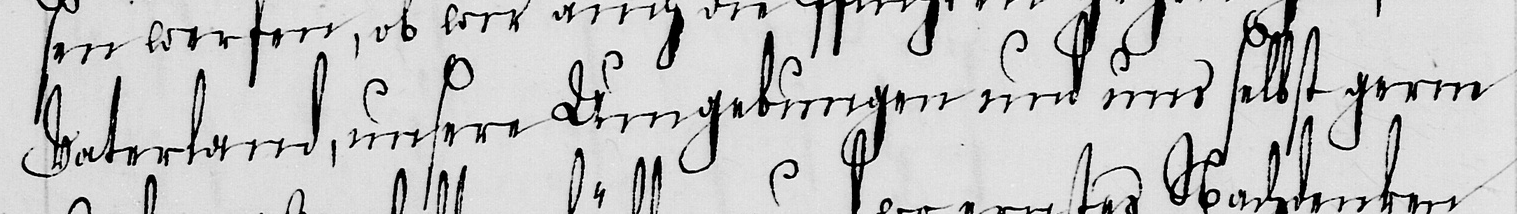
Vaterland, unsere Umgebungen und uns selbst gerne
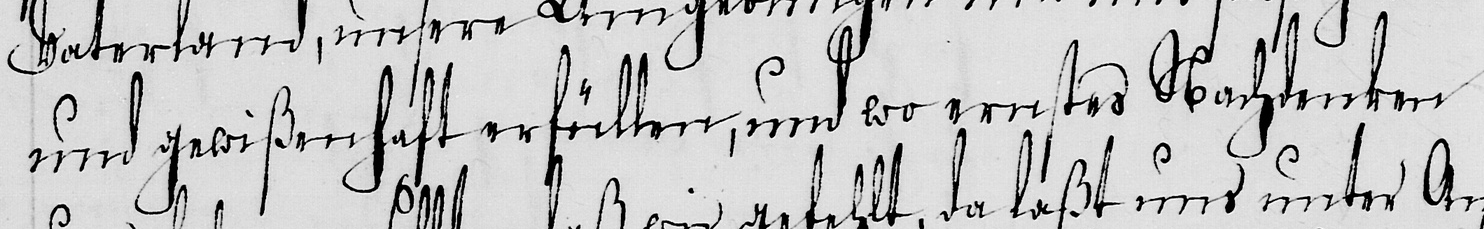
und gewißenhaft erfüllen, und wo ernstes Nachdenken
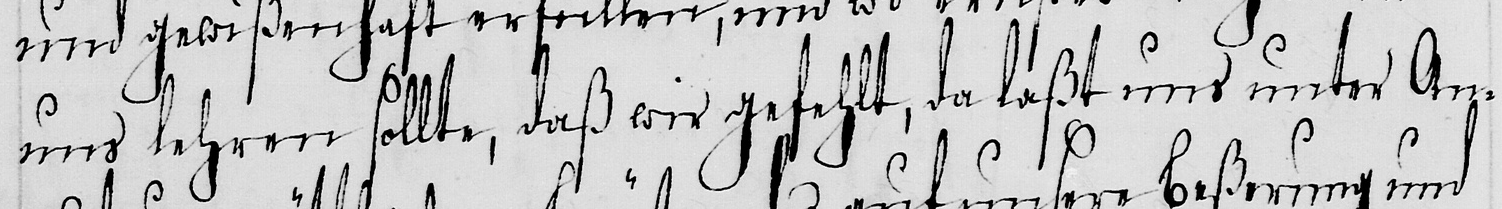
uns lehren sollte, daß wir gefehlt, da laßt uns unter An¬
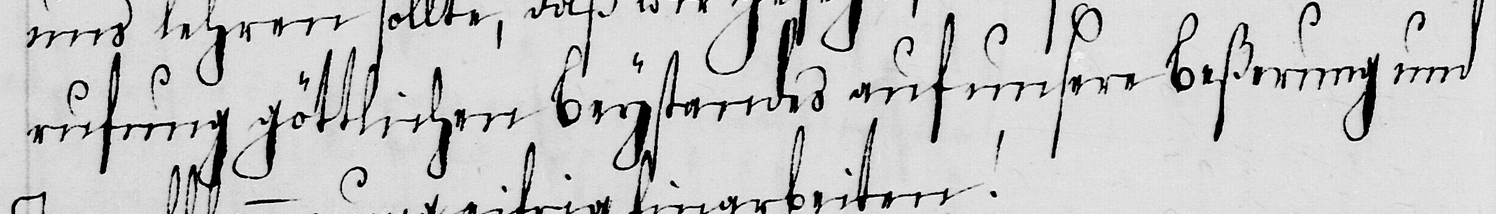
rufung göttlichen Beystandes auf unsere Beßerung und
